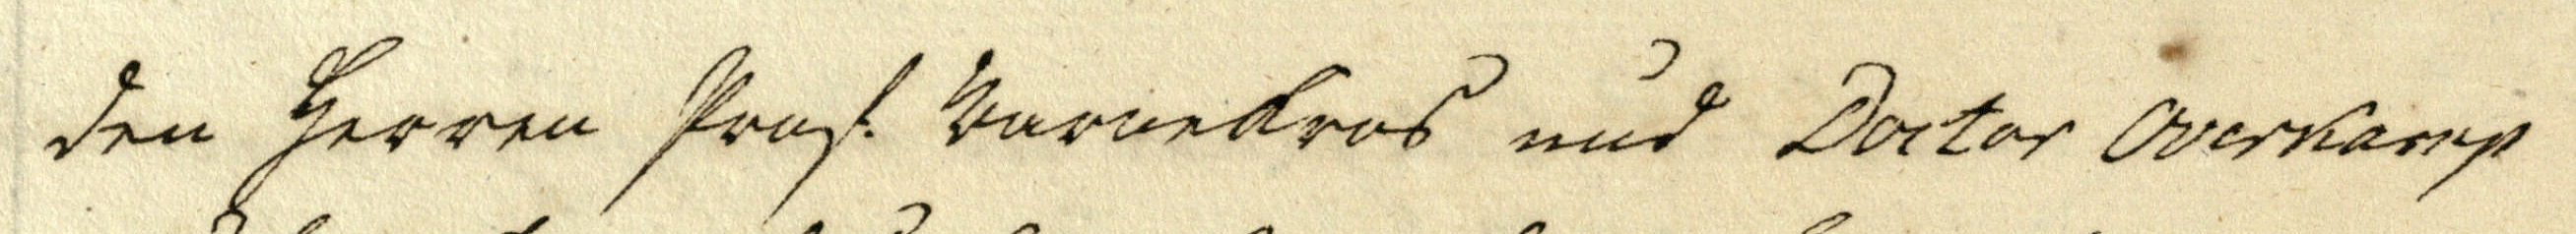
den Herren Prof. Warnekros und Doctor Overkamp
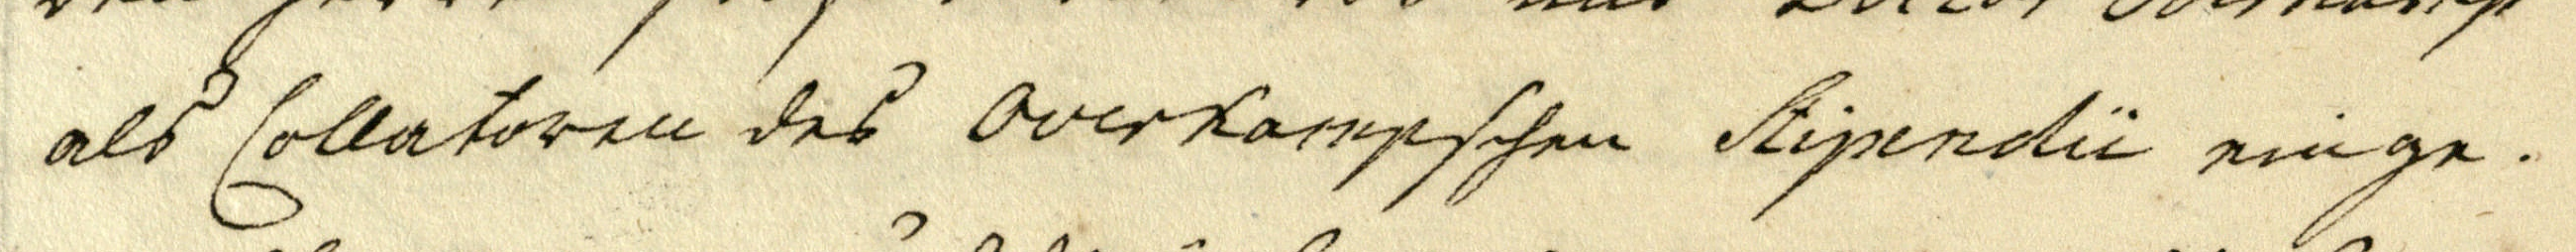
als Collatoren des Overkampschen Stipendii einge¬
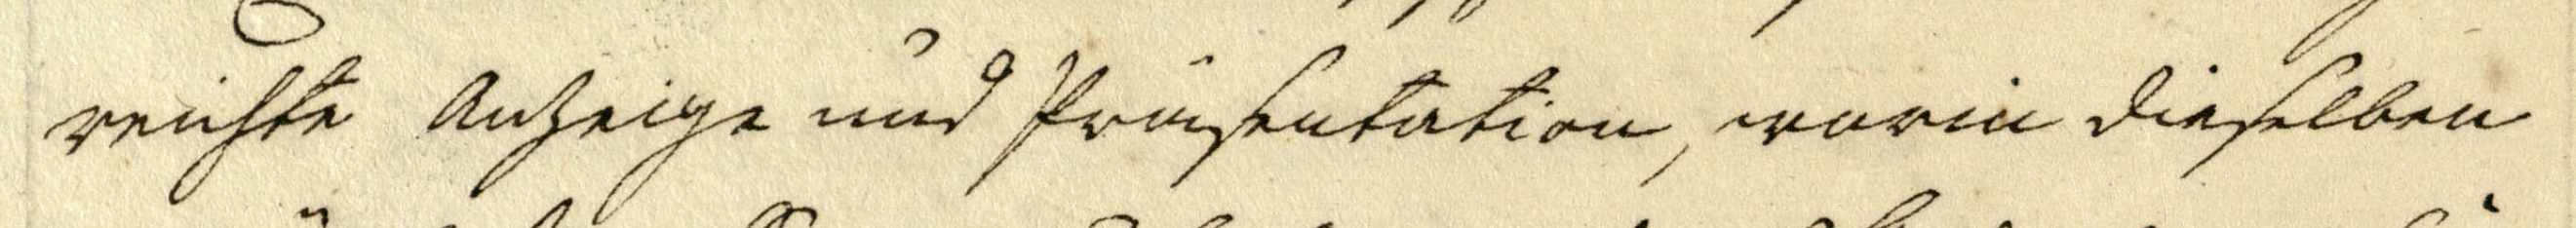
reichte Anzeige und Präsentation, worin dieselben
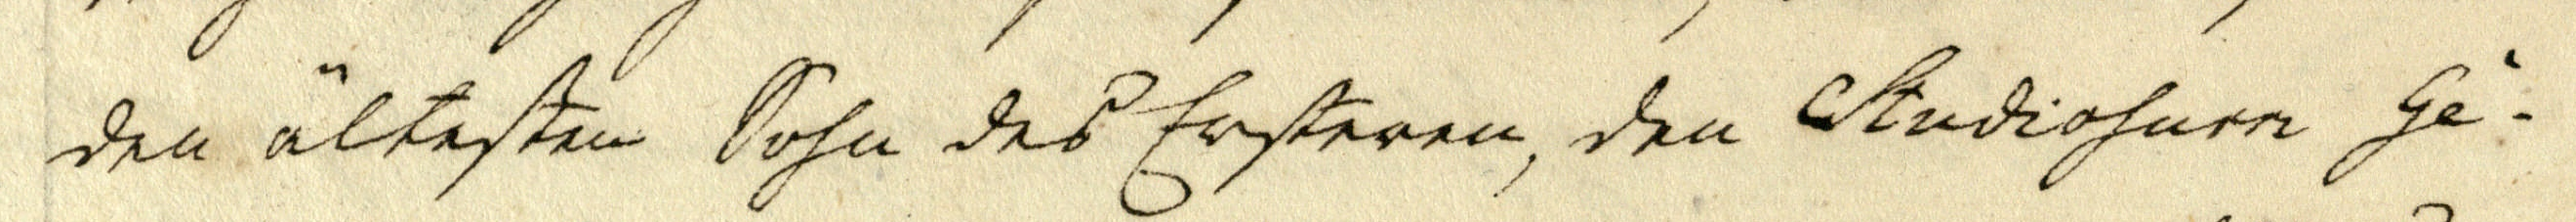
den ältesten Sohn des Ersteren, den Studiosum Ge¬
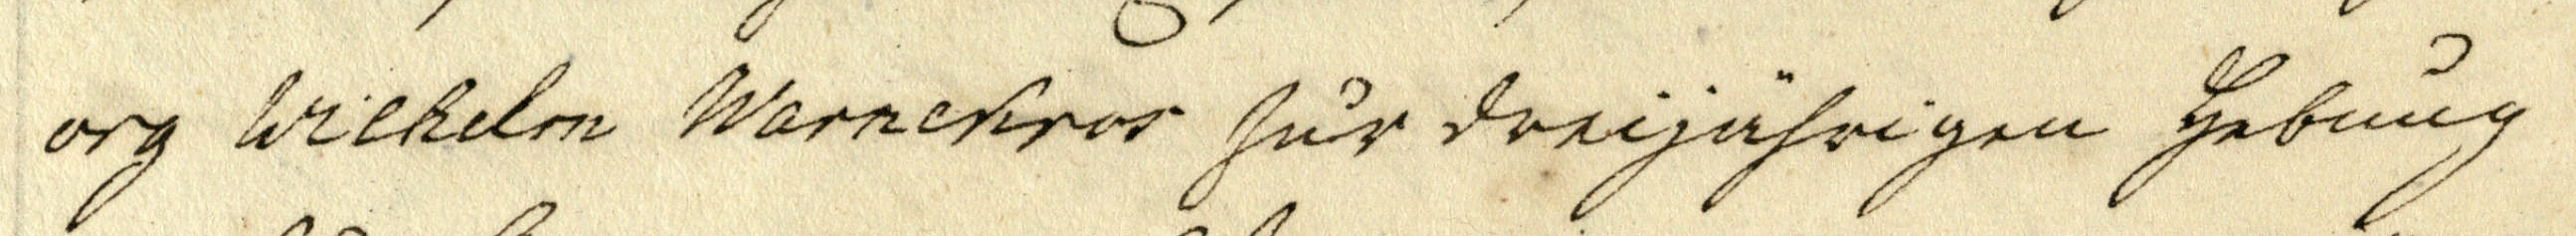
org Wilhelm Warnekros zur dreijährigen Hebung
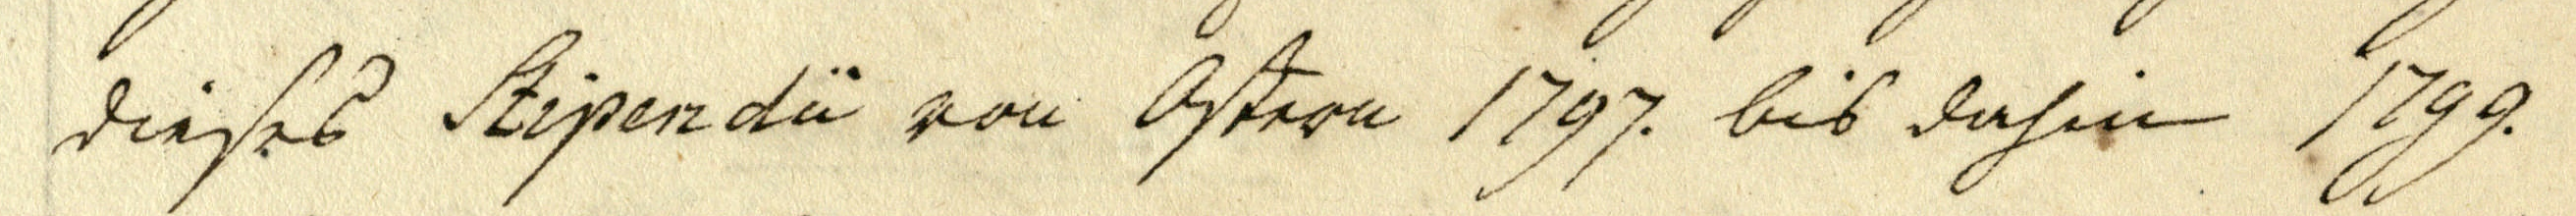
dieses Stipendii von Ostern 1797. bis dahin 1799.
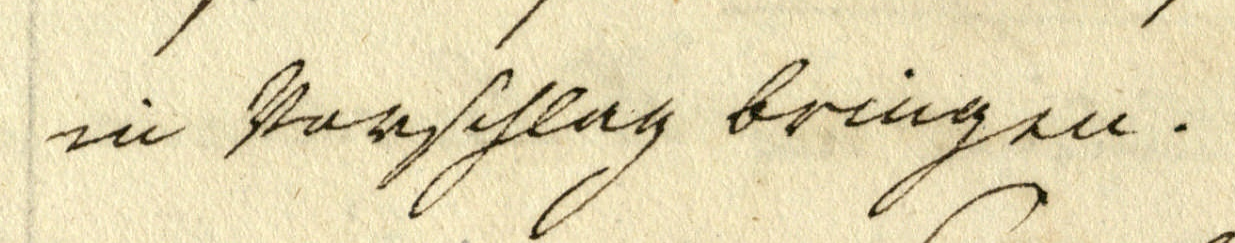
in Vorschlag bringen.
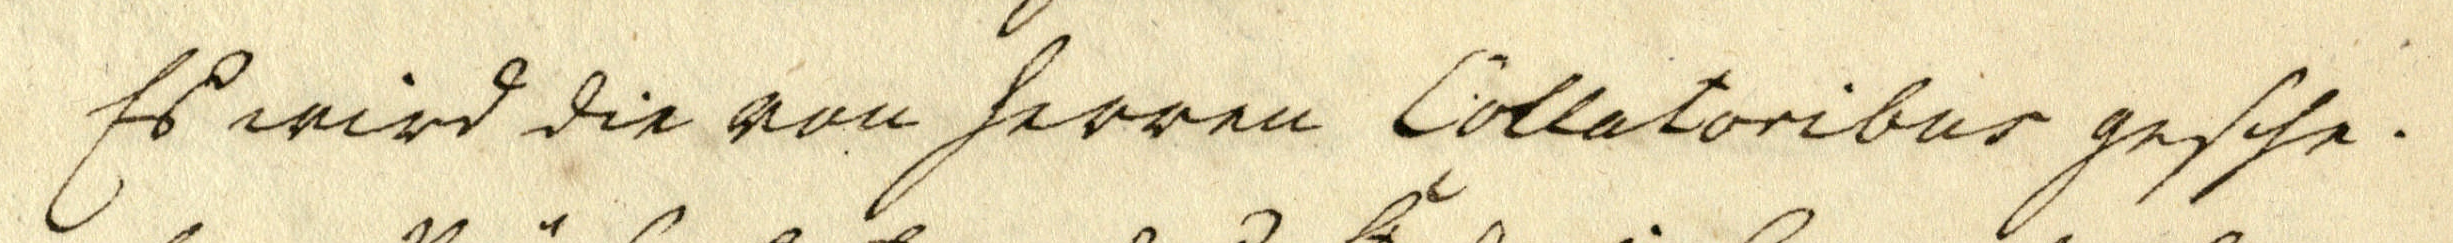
Es wird die von herren Collatoribus gesche¬
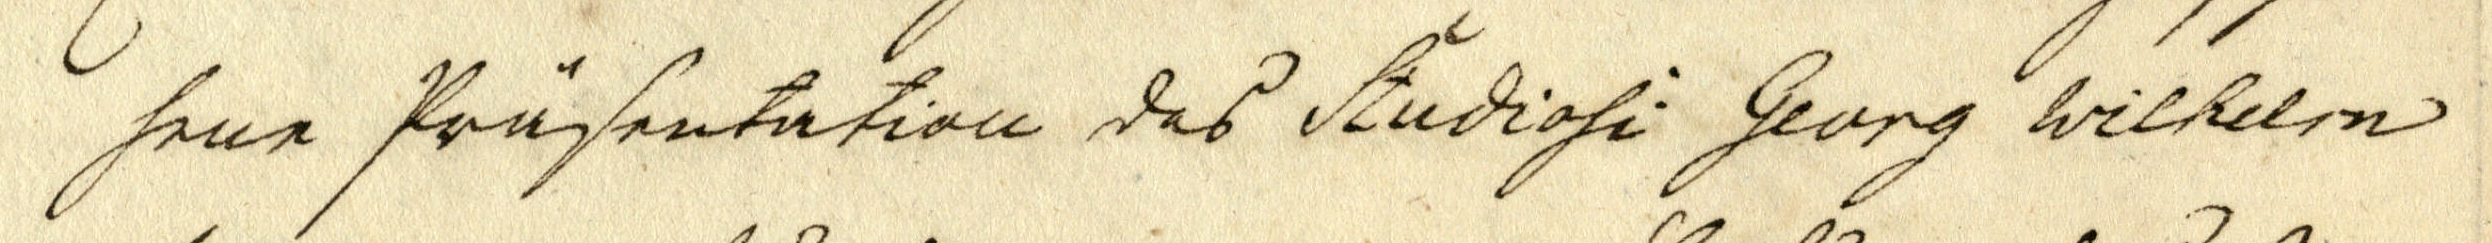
hene Präsentation des Studiosi Georg Wilhelm
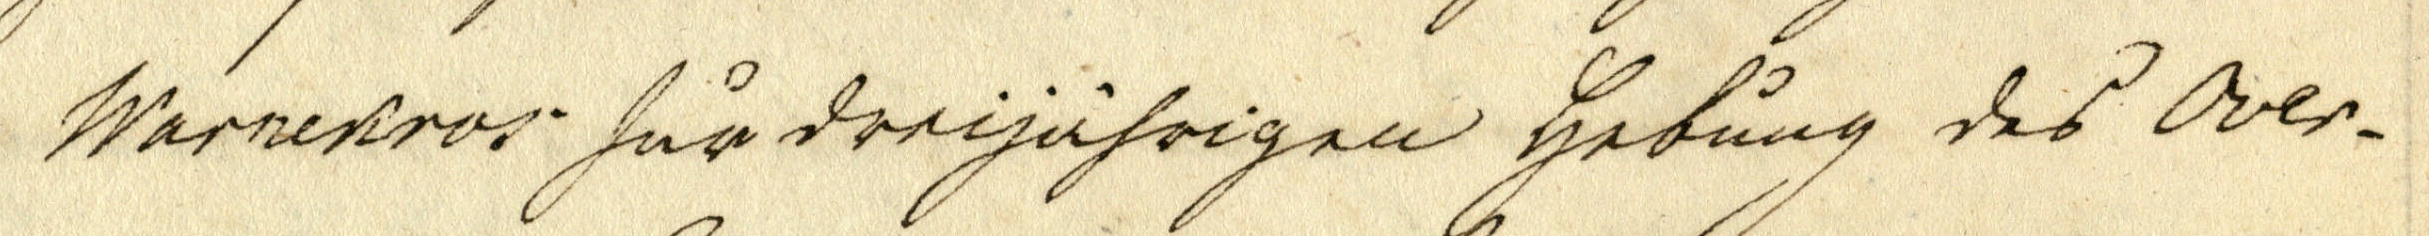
Warnekros zur dreijährigen Hebung des Over¬
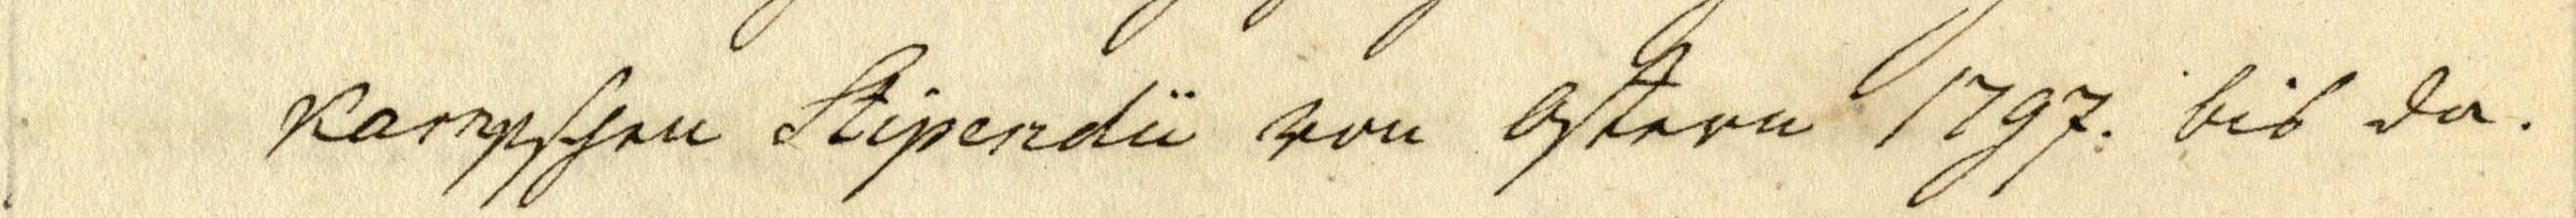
kampschen Stipendii von Ostern 1797. bis da¬
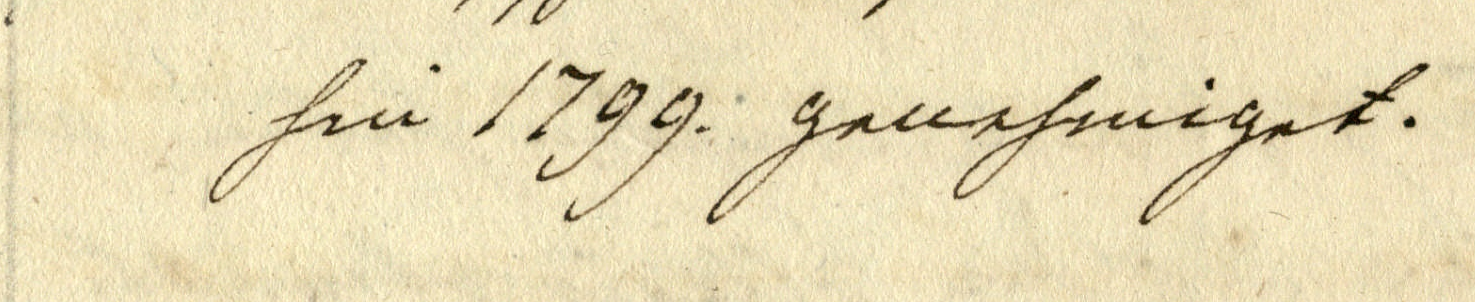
hin 1799. genehmiget.
